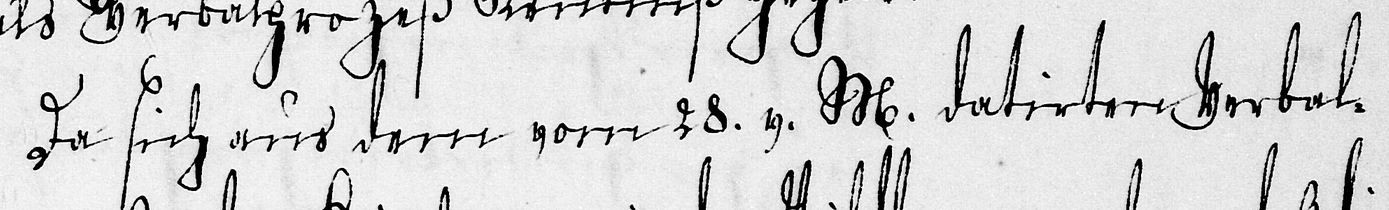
Da sich aus dem vom 28. v. M. datirten Verbal¬
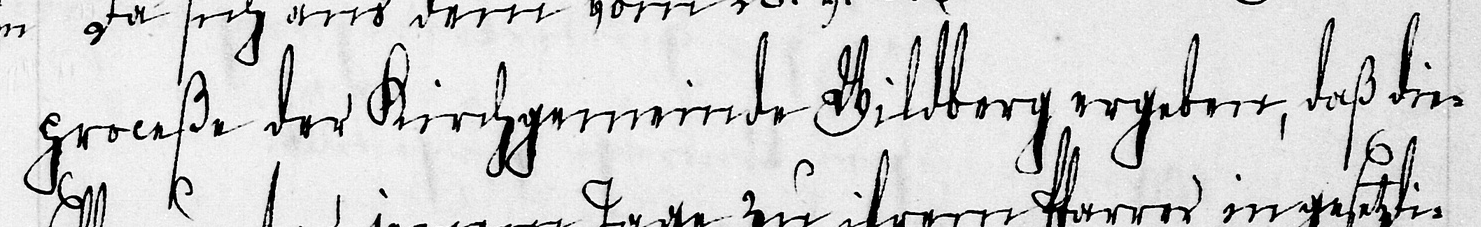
proceße der Kirchgemeinde Wildberg ergeben, daß die¬
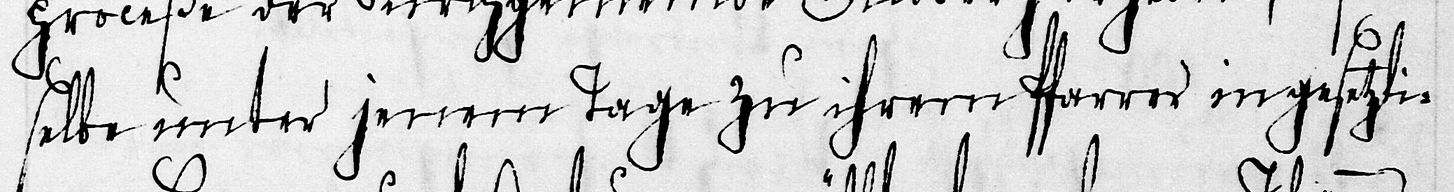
selbe unter jenem Tage zu ihrem Pfarrer in gesetzli¬
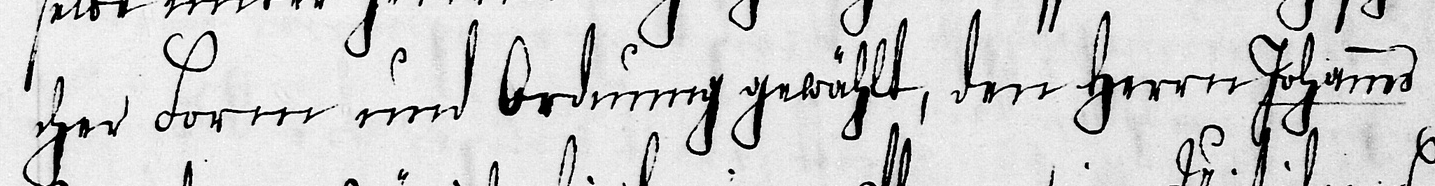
cher Form und Ordnung gewählt, den Herrn Johannes
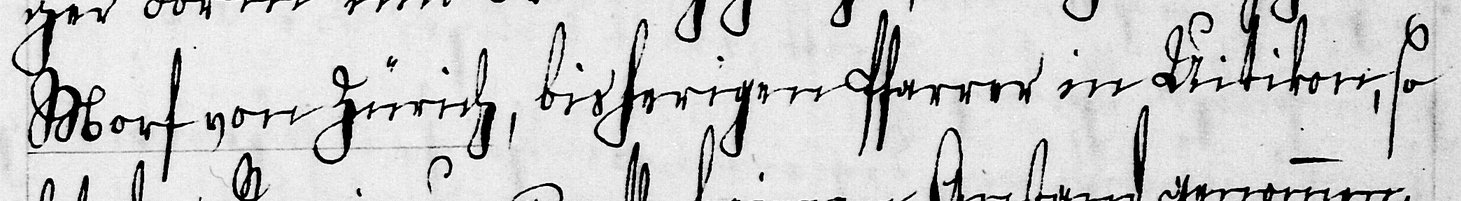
Morf von Zürich, bisherigen Pfarrer in Uitikon, so
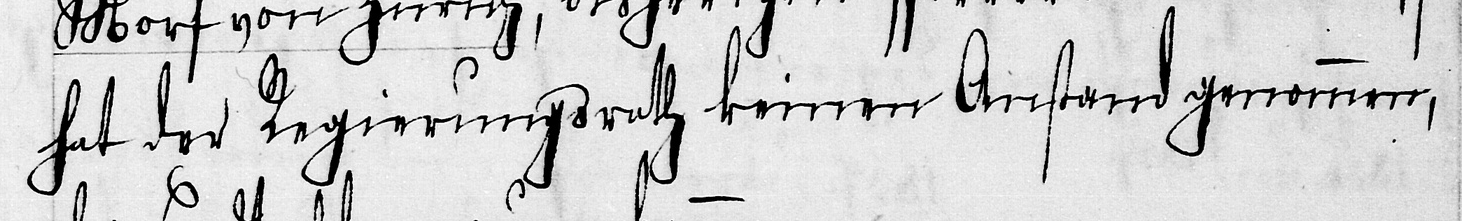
hat der Regierungsrath keinen Anstand genommen
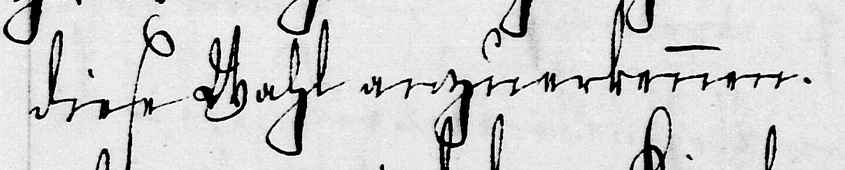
diese Wahl anzuerkennen.
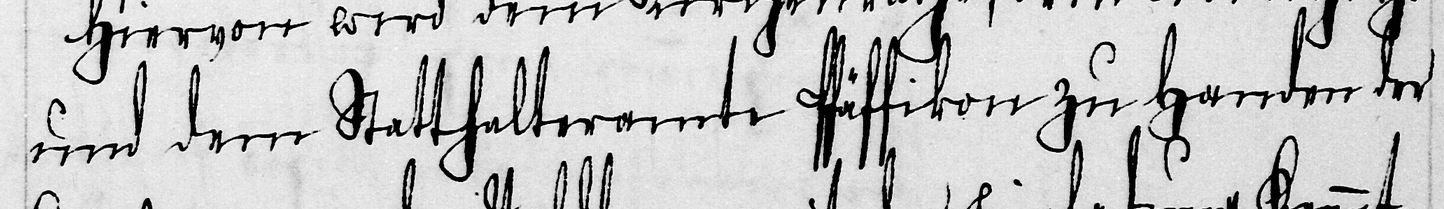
und dem Statthalteramte Pfäffikon zu Handen der
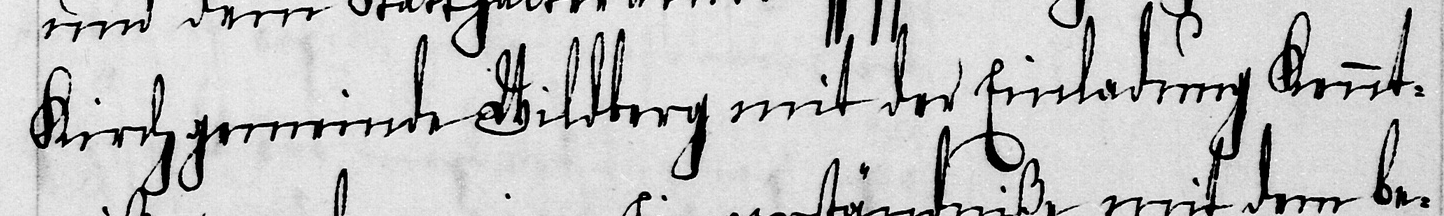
Kirchgemeinde Wildberg mit der Einladung Kennt¬
